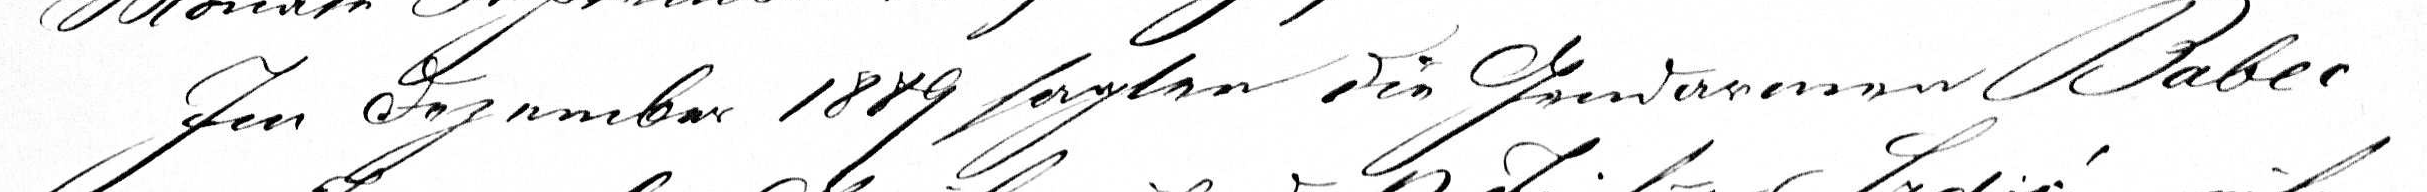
Jm Dezember 1889 sagten die Gendarmen Babec
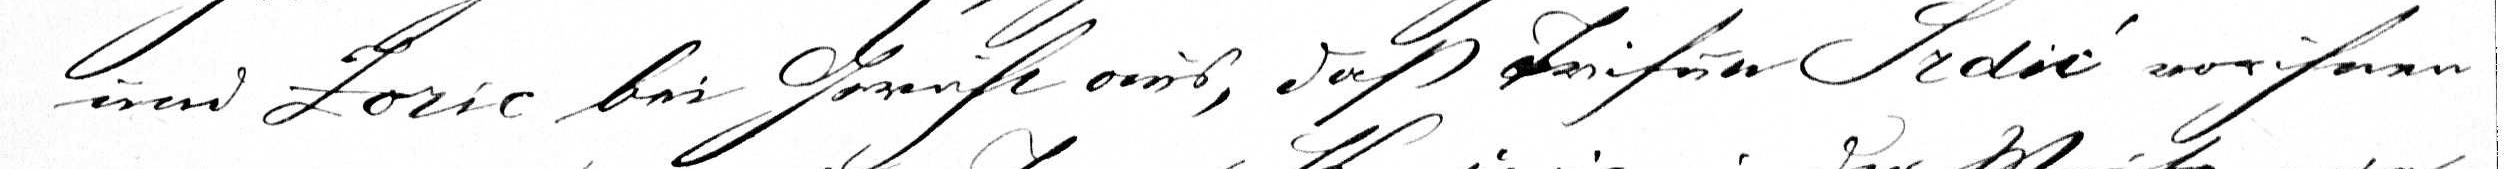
und Zoric bei Gericht aus, daß Trifun Srdić xx
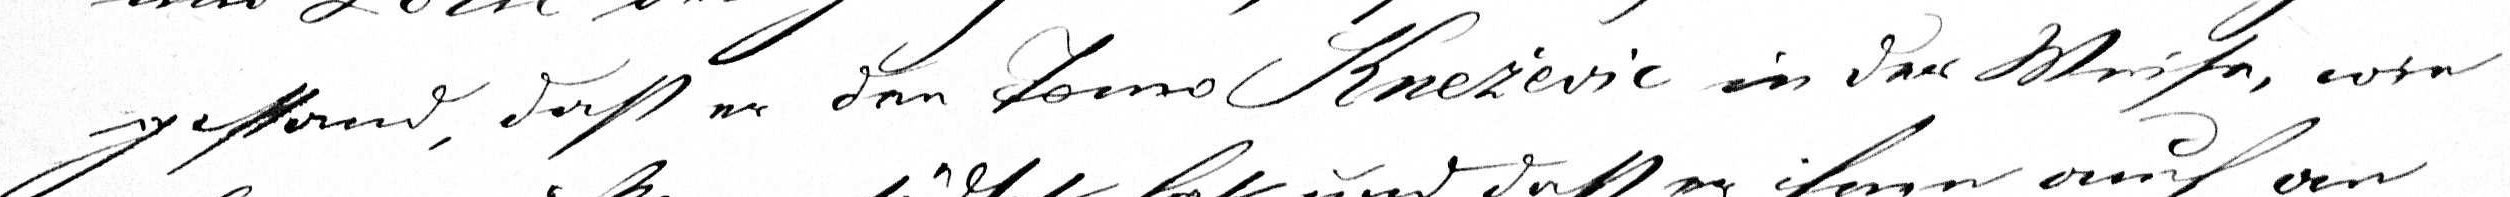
gestand, daß er den Tomo Kneževic in der Weise, wie
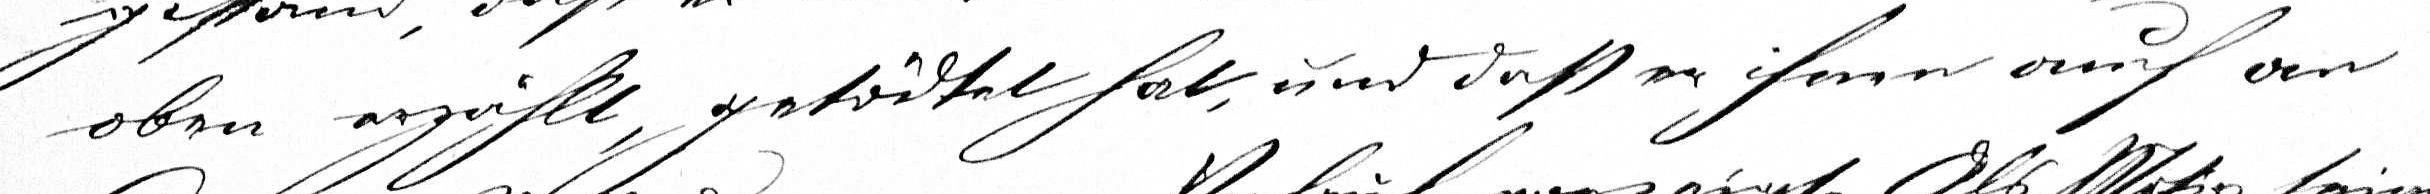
oben erzählt, getödtet hat, und daß er ihnen auch an
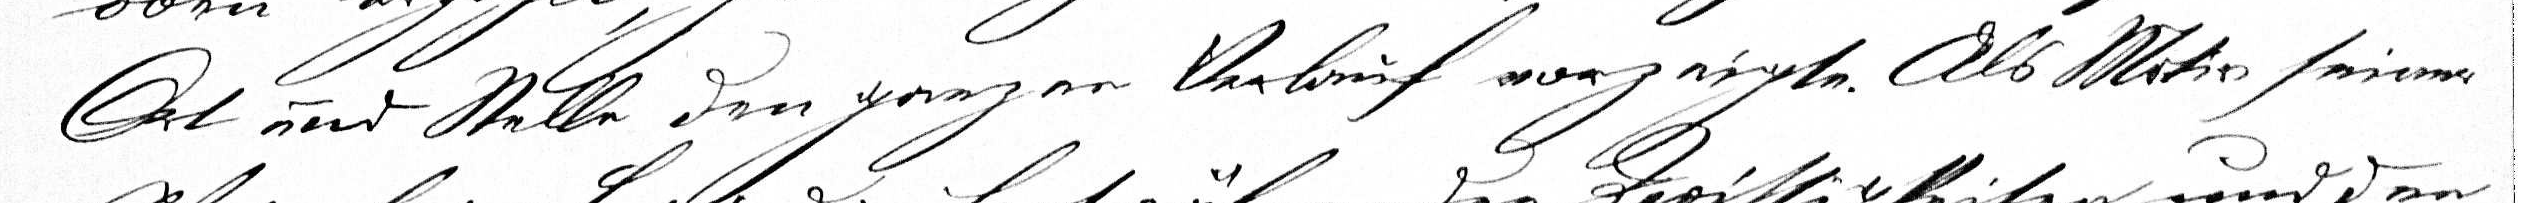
Ort und Stelle den ganzen Verlauf vorzeigte. Als Motiv seiner
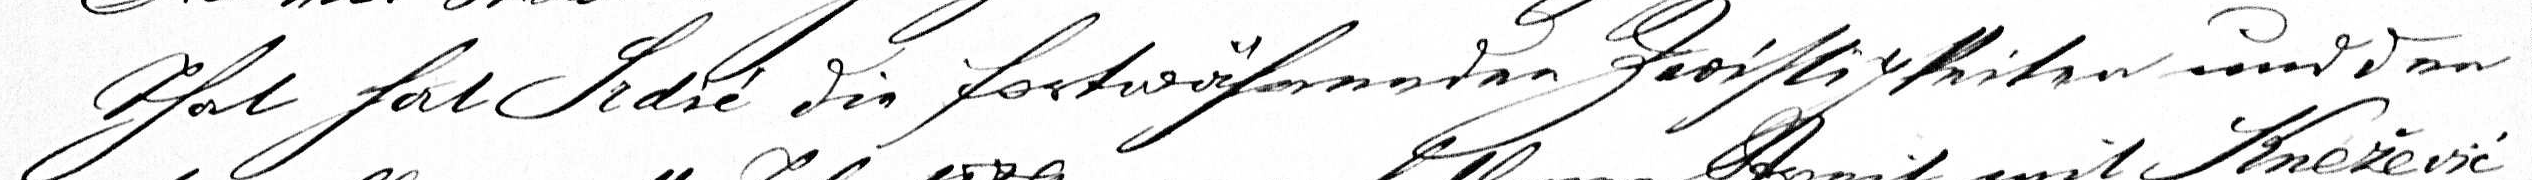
That hat Srdić die fortwähnenden Zwistigkeiten und den
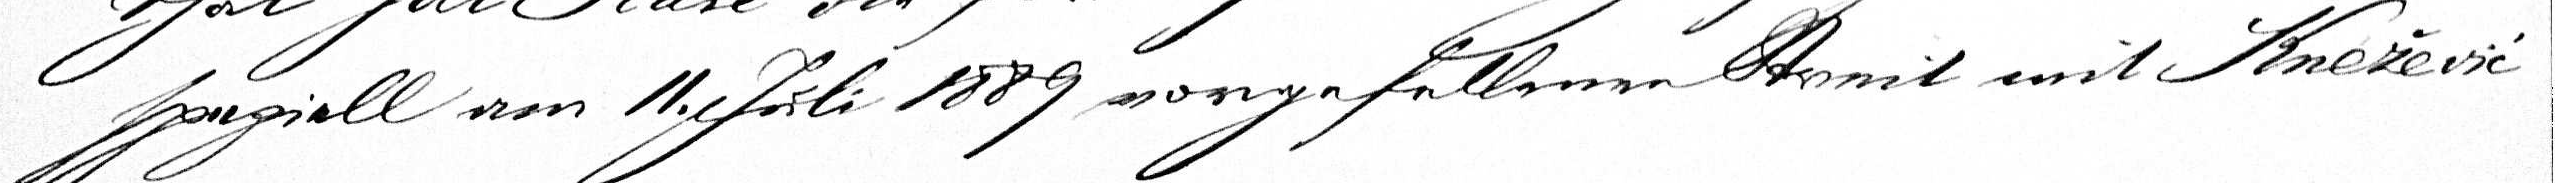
speziell am 11. Juli 1889 vorgefallenen Streit mit Knežević
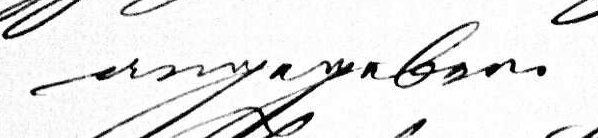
angegeben.
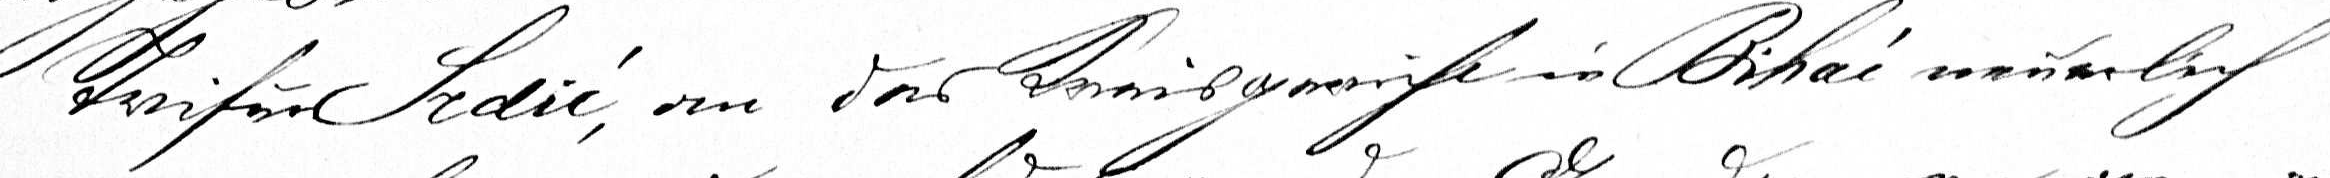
Trifun Srdić, an das Kreisgericht in Bihać neuerlich
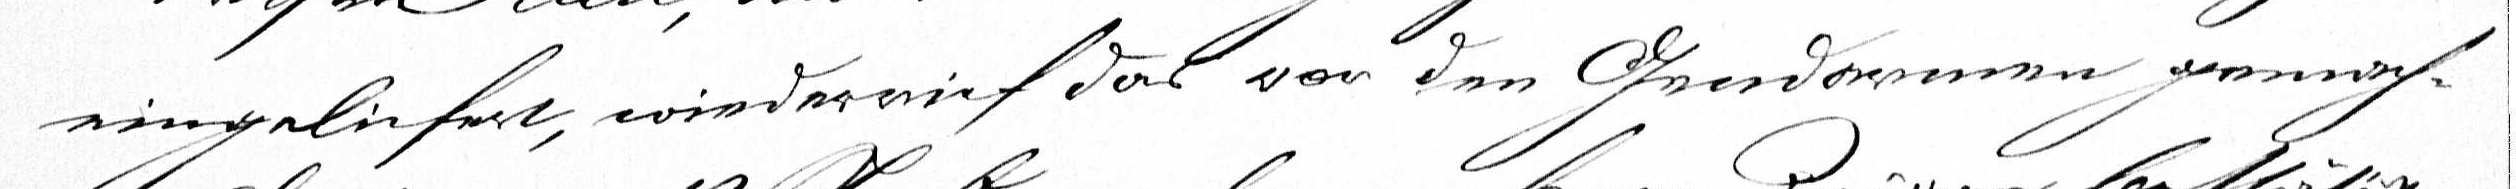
eingeliefert, wiederrief das vor den Gendarmen gemach¬
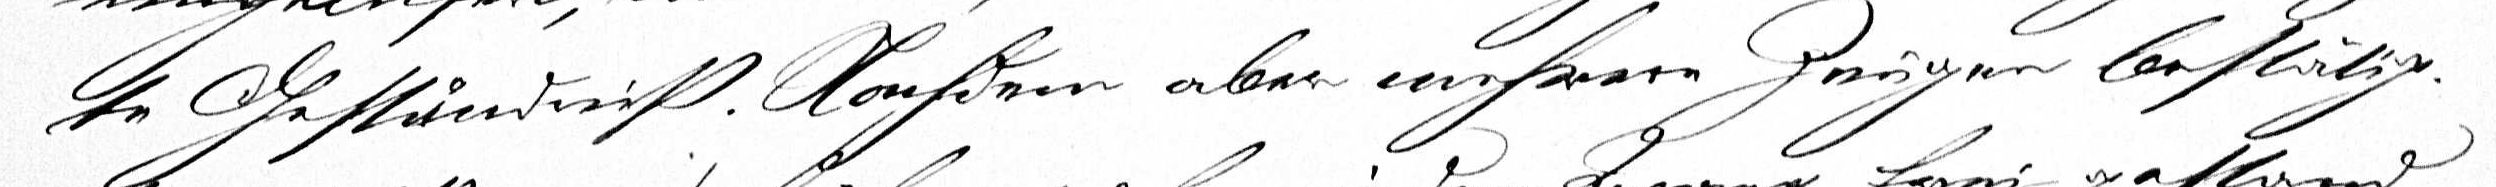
te Geständniß. Nachdem aber mehrere Zeugen bestätig¬
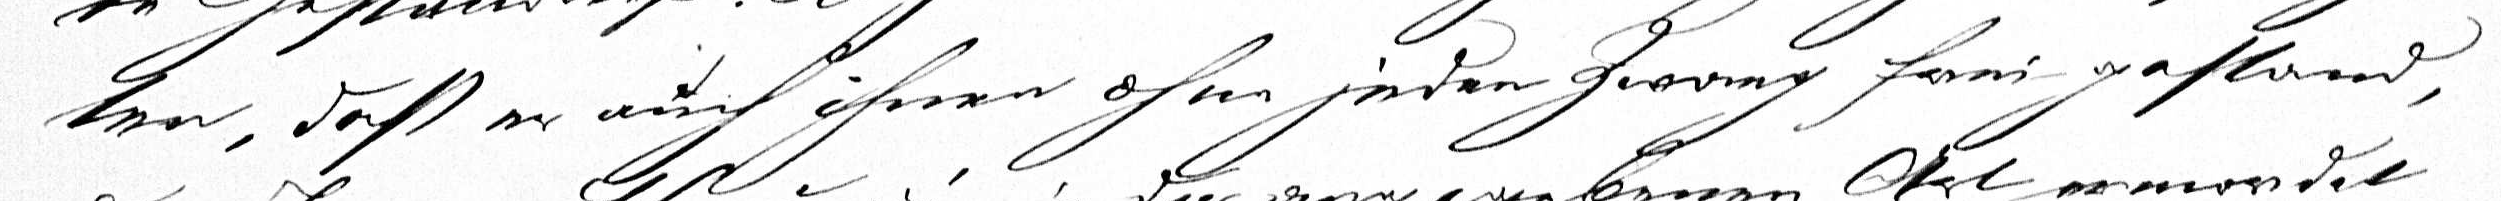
ten, daß er auch ihnen ohne jeden Zwang frei gestand,
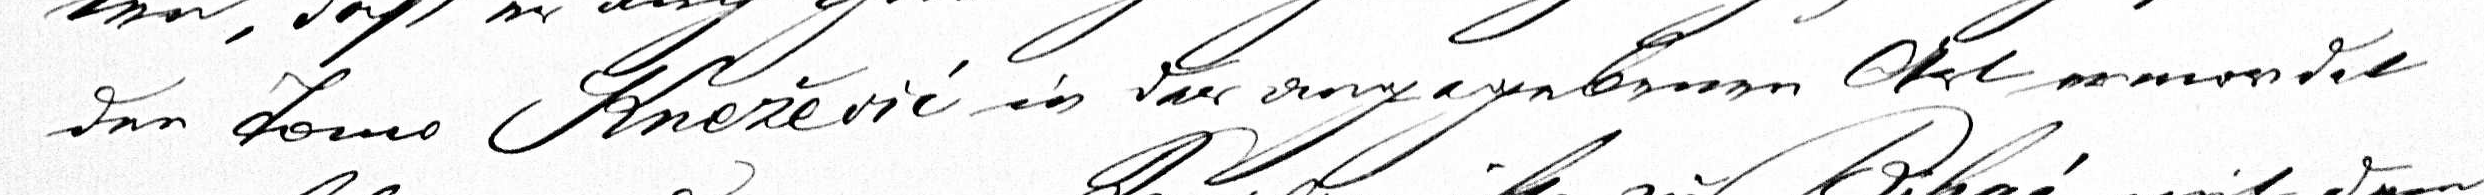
den Tomo Knežević in der angegebenen Art ermordet
